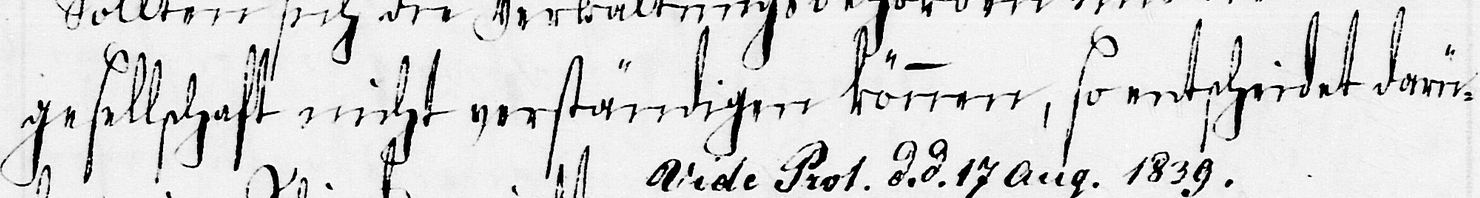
gesellschaft nicht verständigen können, so entscheidet darü¬
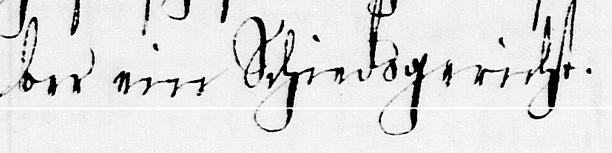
ber ein Schiedsgericht.
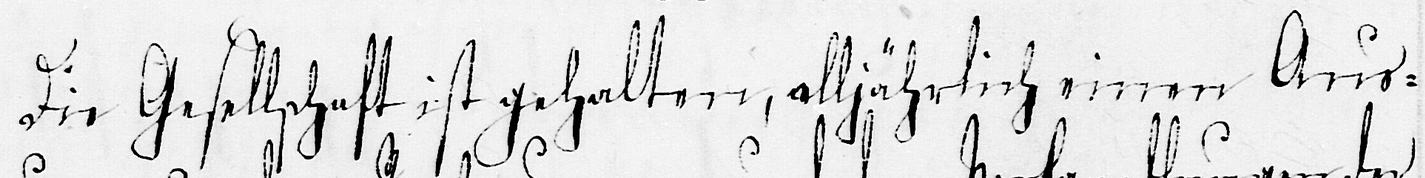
Die Gesellschaft ist gehalten, alljährlich einen Aus¬
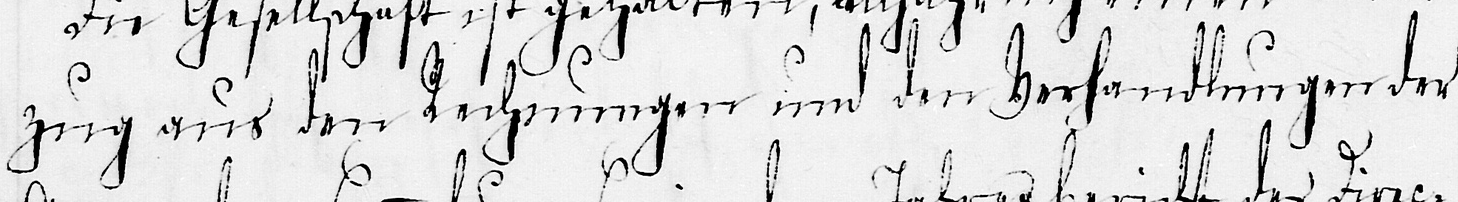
zug aus den Rechnungen und den Verhandlungen der
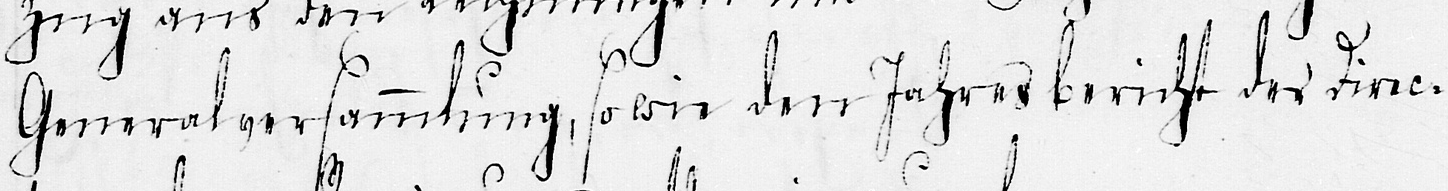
Generalversammlung, sowie den Jahresbericht der Direc¬
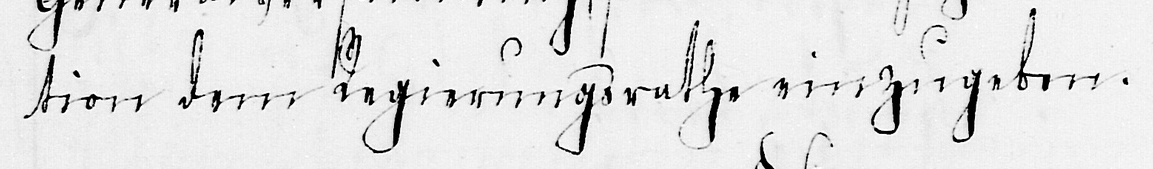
tion dem Regierungsrathe einzugeben.
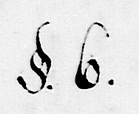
§. 6.
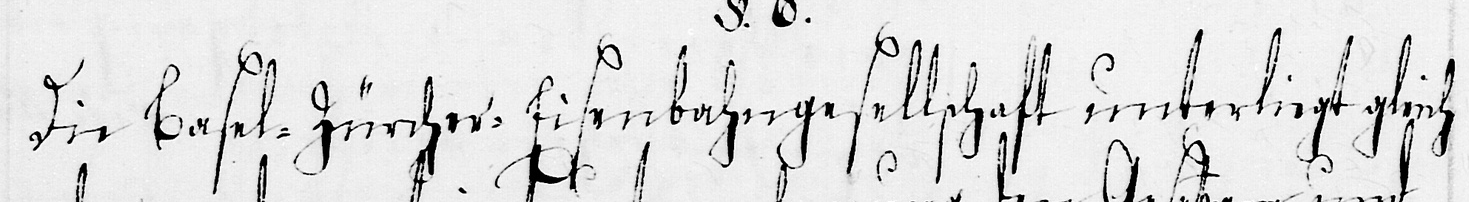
Die Basel-Zürcher-Eisenbahngesellschaft unterliegt glei¬
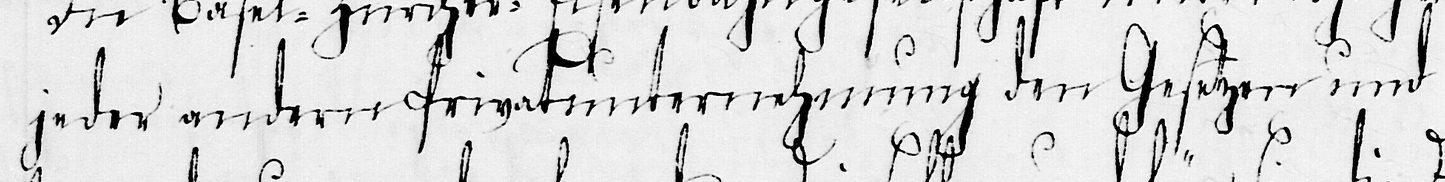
jeder andern Privatunternehmung den Gesetzen und
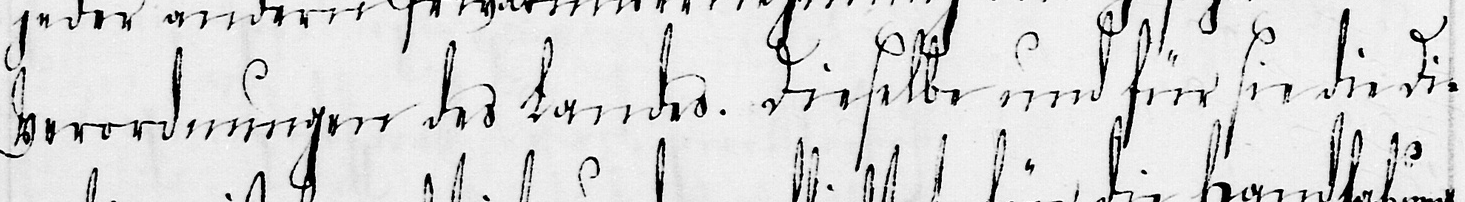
Verordnungen des Landes. Dieselbe und für sie die Di¬
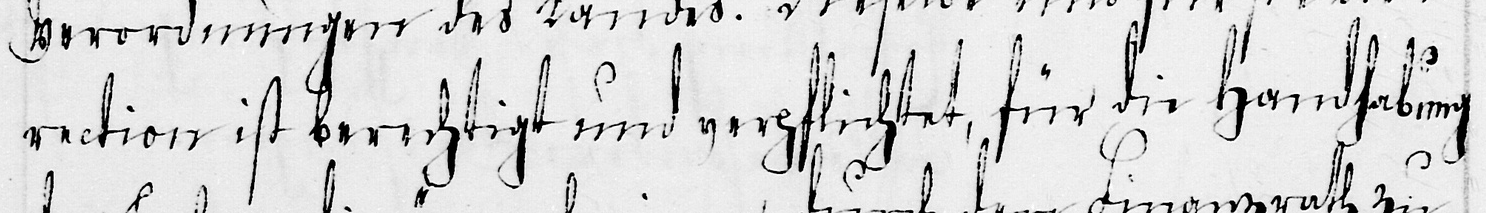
rection ist berechtigt und verpflichtet, für die Handhabung
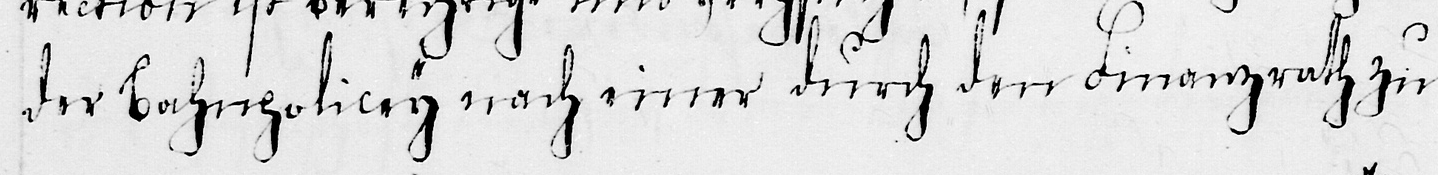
der Bahnpolicey nach einer durch den Finanzrath zu
